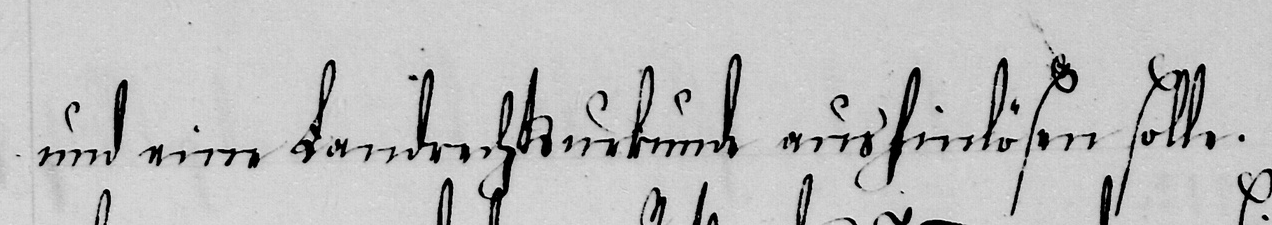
und eine Landrechtsurkunde aushinlösen solle.
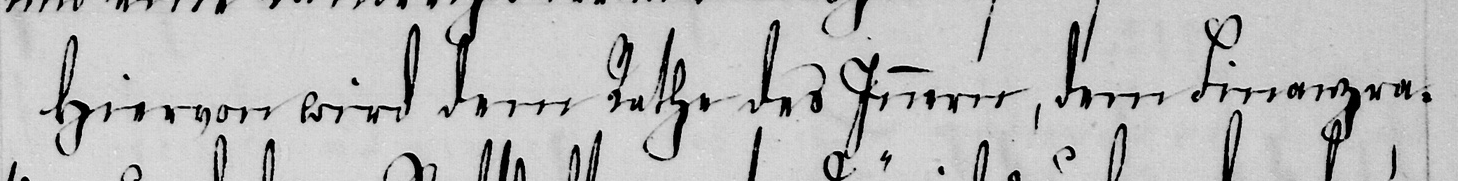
Hiervon wird dem Rathe des Innern, dem Finanzra¬
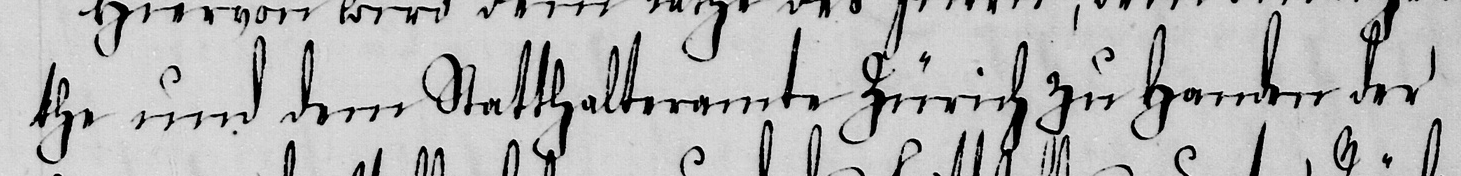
the und dem Statthalteramte Zürich zu Handen der
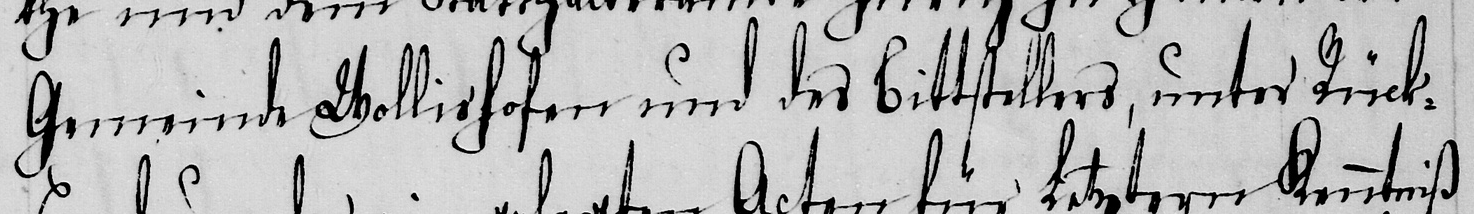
Gemeinde Wollishofen und des Bittstellers, unter Rück¬
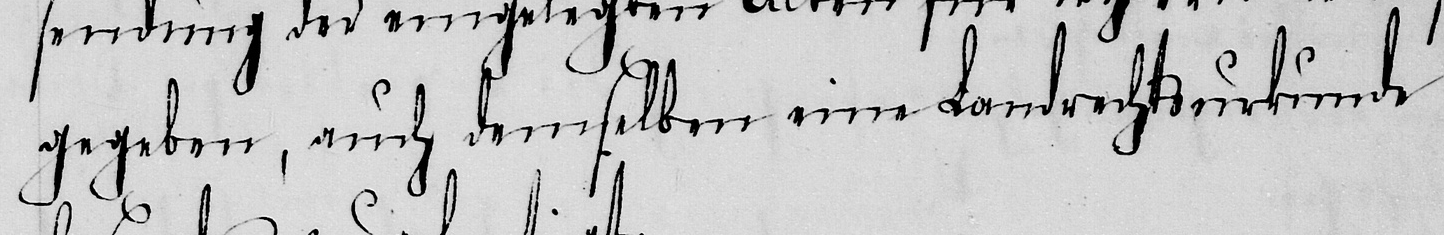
gegeben, auch demselben eine Landrechtsurkunde
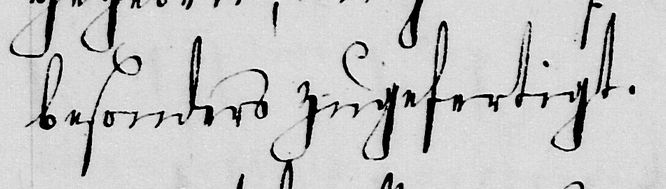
besonders zugefertigt.
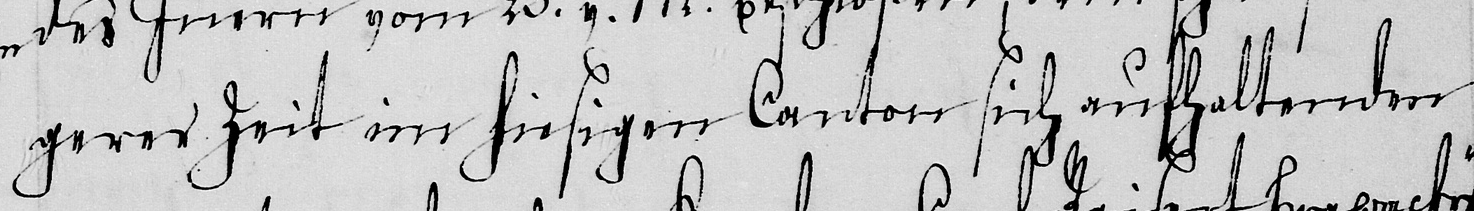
gerer Zeit im hiesigen Canton sich aufhaltenden
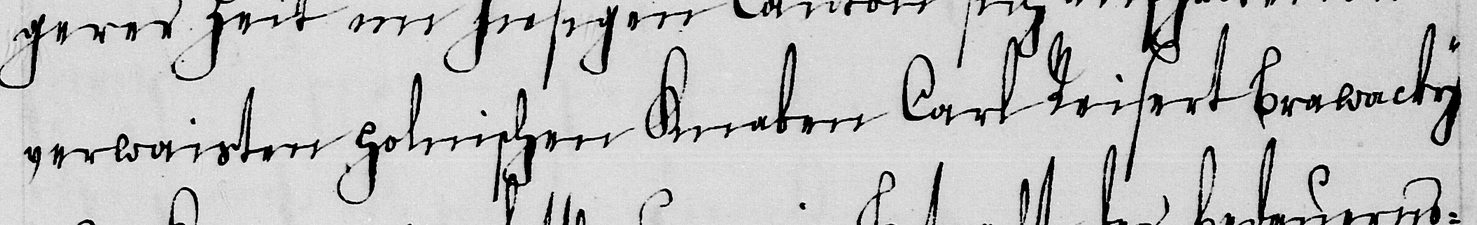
verwaisten polnischen Knaben Carl Reisert Brawacky
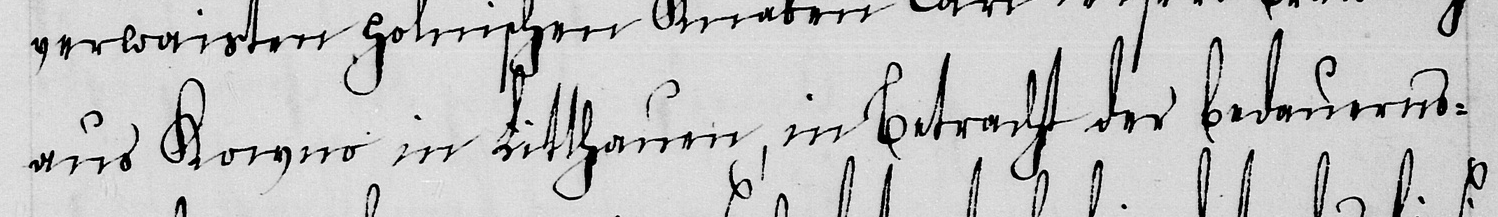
aus Kowno in Litthauen, in Betracht der bedauerns¬
